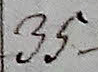35
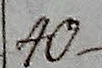40
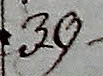39
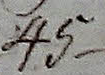45
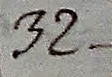32
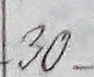30
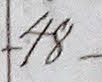48
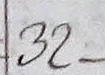32
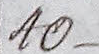40
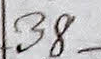38
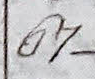67
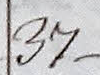37
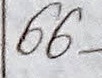66
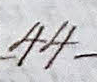44
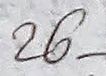26
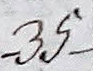35
